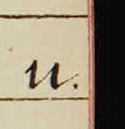11.
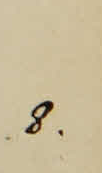8.
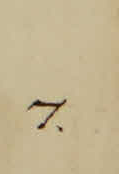7.
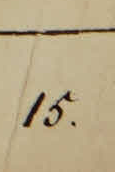15.
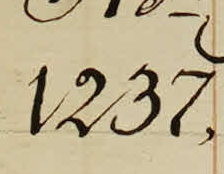1237
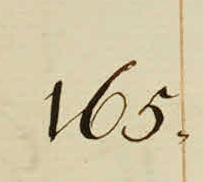165
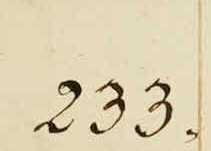233
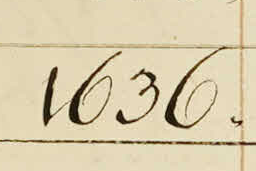1636
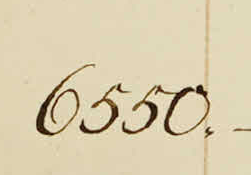6550,
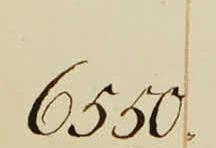6550
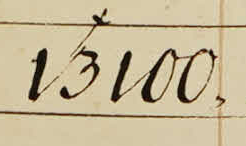13100
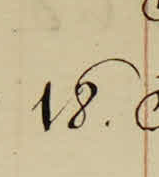18.
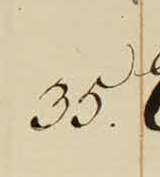35.
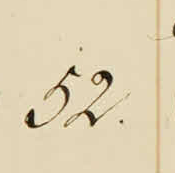52.
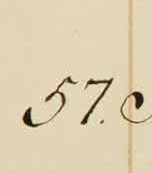57.
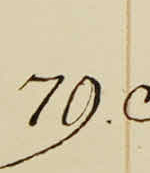79.
